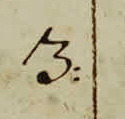3:
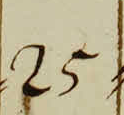25
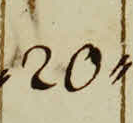20
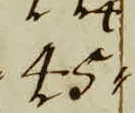45
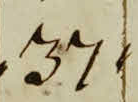47
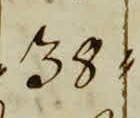38
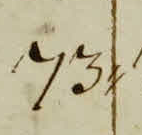73
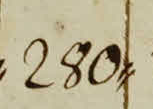280
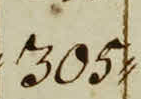305
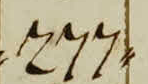277
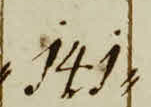141
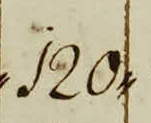120
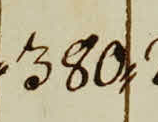380
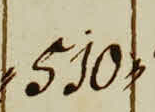510
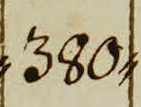380
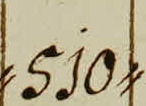510
